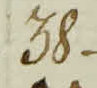38
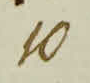10
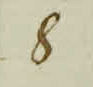8
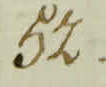52
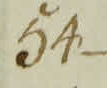54
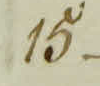15
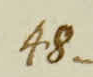48
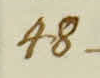48
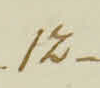12
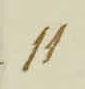11
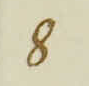8
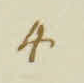4
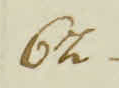62
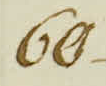60
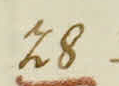28
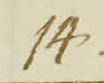14
